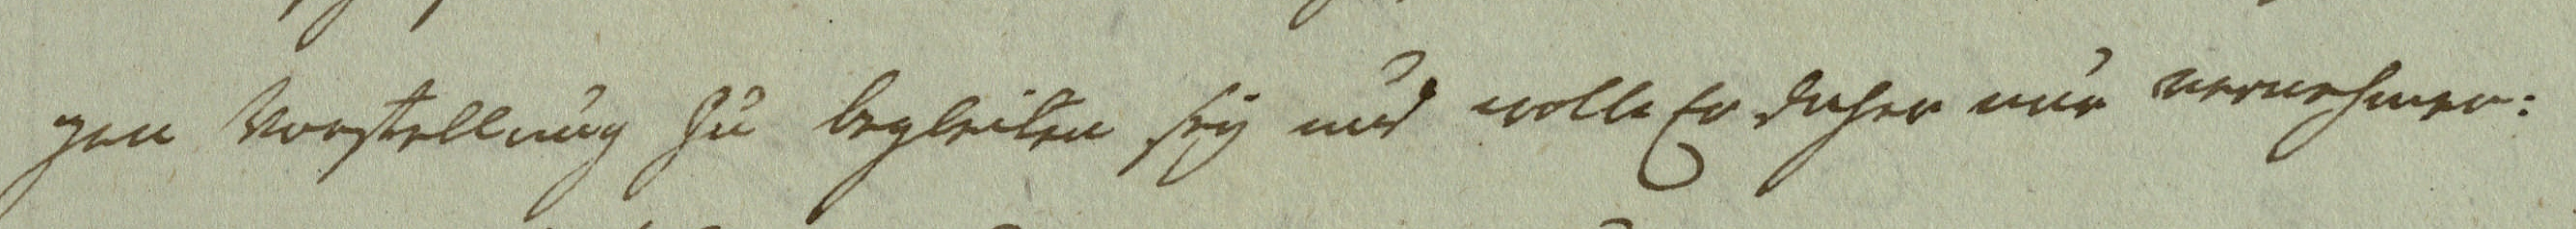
gen Vorstellung zu begleiten seÿ und wolle Er daher nur vernehmen:
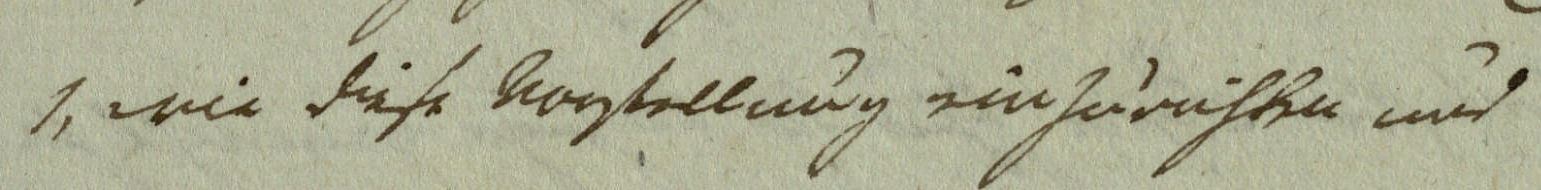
1, wie diese Vorstellung einzurichten und
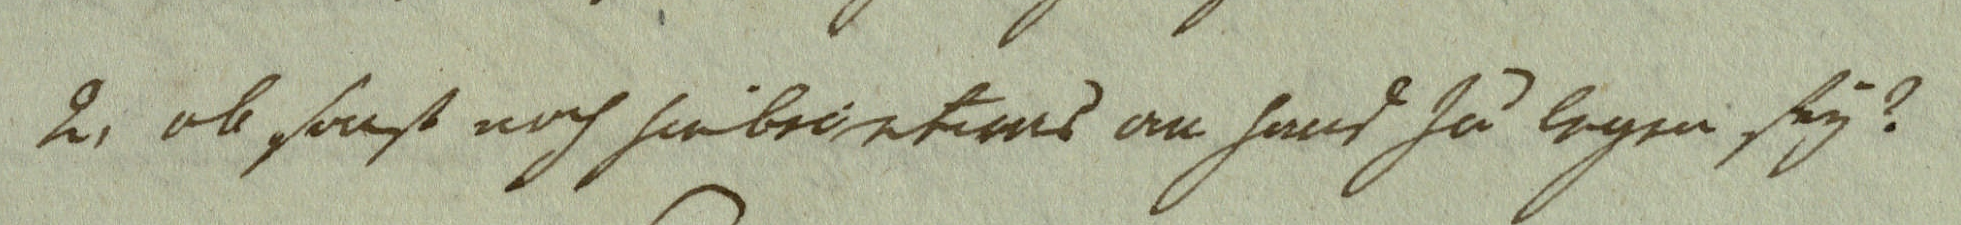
2, ob sonst noch hiebei etwas an hand zu legen seÿ?
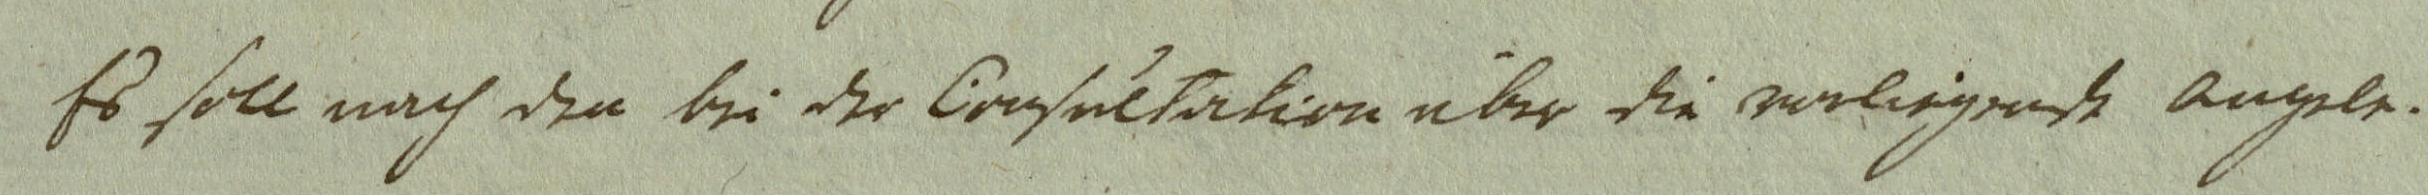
Es soll nach den bei der Consultation über die vorliegende Angele¬
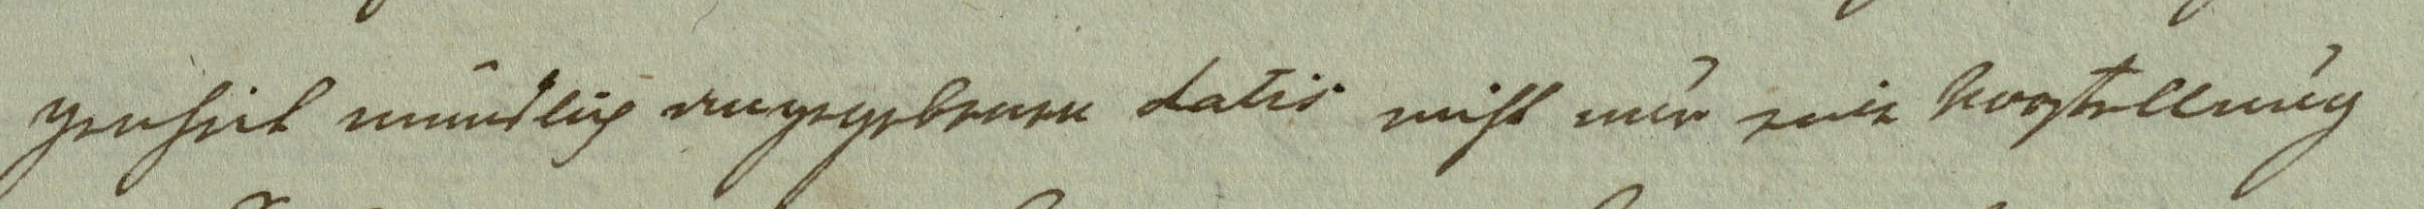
genheit mündlich angegebenen datis nicht nur eine Vorstellung
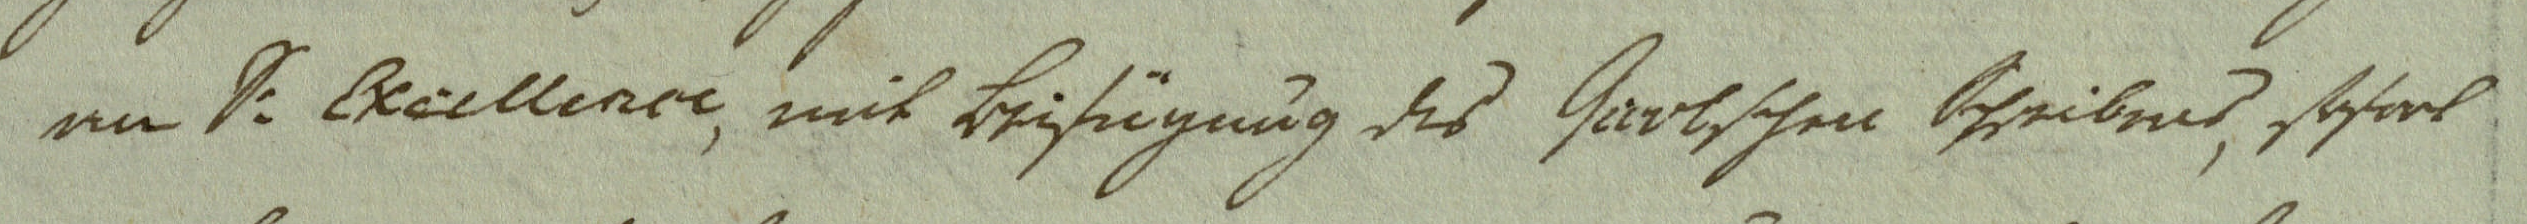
an Sr. Excellence, mit Beifügung des Ricotschen Schreibens, sofort
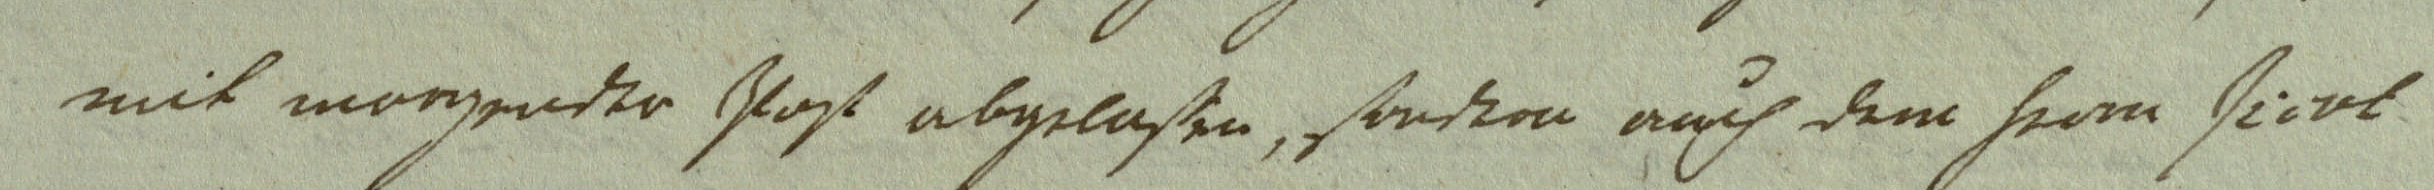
mit morgender Post abgelassen, sondern auch dem herrn Ricot
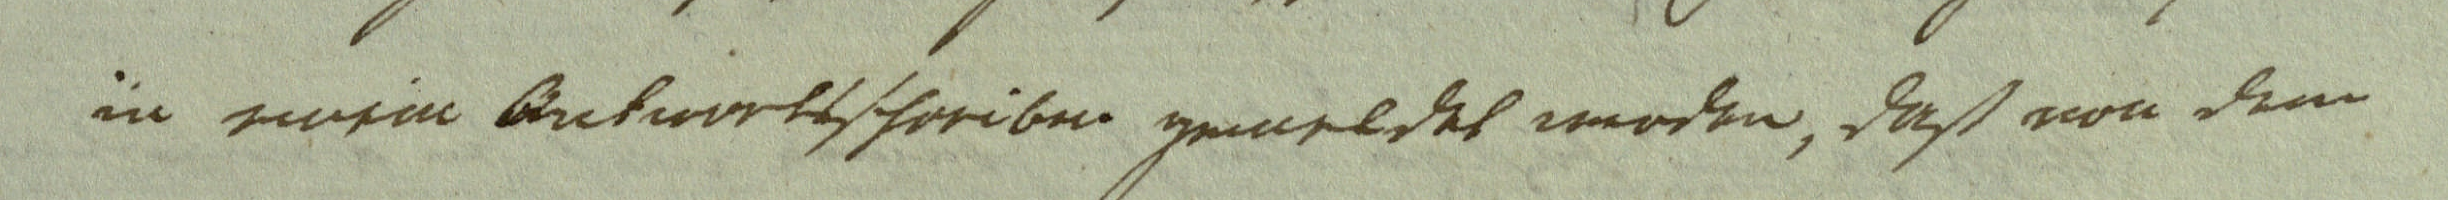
in einem Antwortsschreiben gemeldet werden, daß von dem
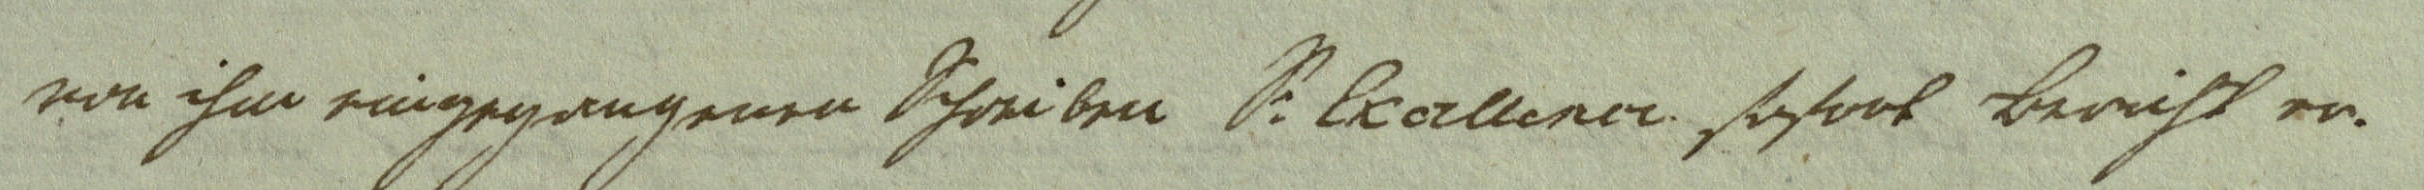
von ihm eingegangenen Schreiben Sr. Excellence sofort Bericht er¬
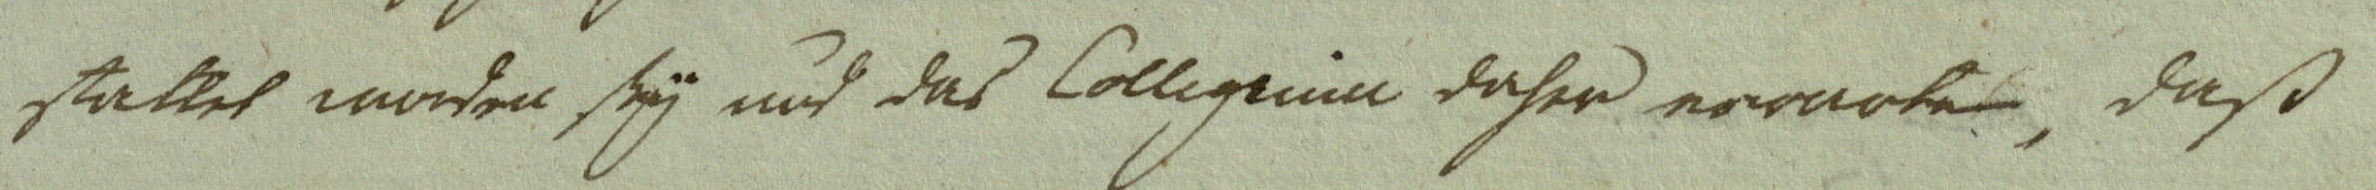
stattet worden seÿ und das Collegium daher erwarte, daß
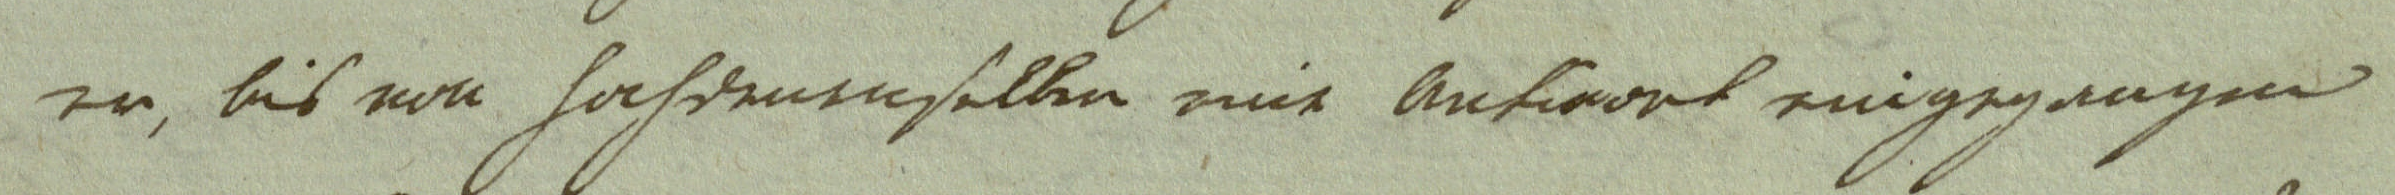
er, bis von hochdenenselben eine Antwort eingegangen
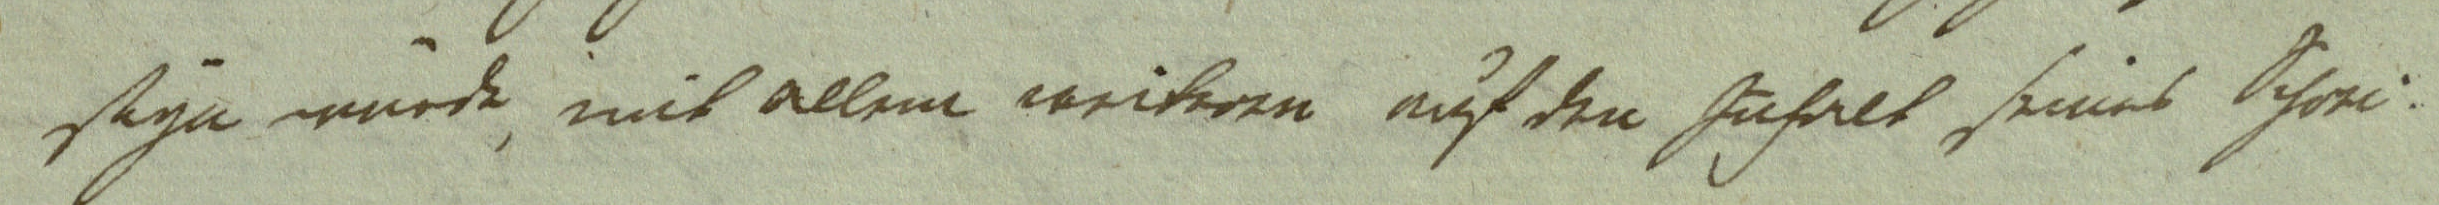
seÿn würde, mit allem weiteren auf den Inhalt seines Schrei¬
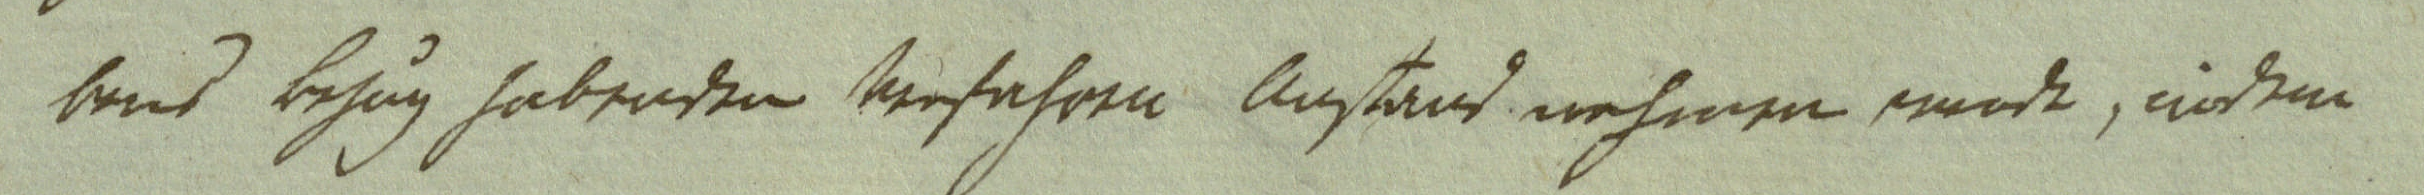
bens Bezug habenden Verfahren Anstand nehmen werde, indem
